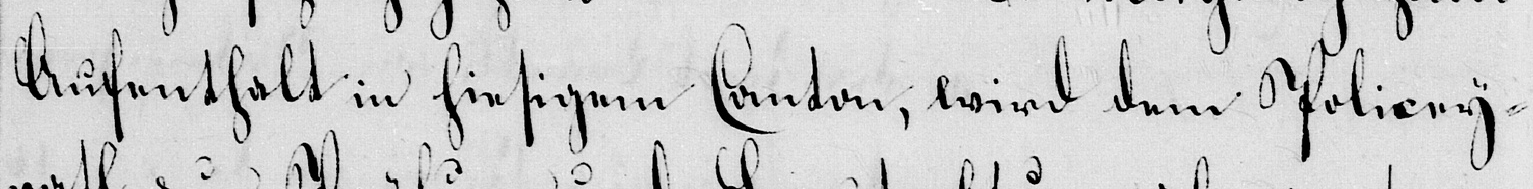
Aufenthalt in hiesigem Canton, wird dem Polizey¬
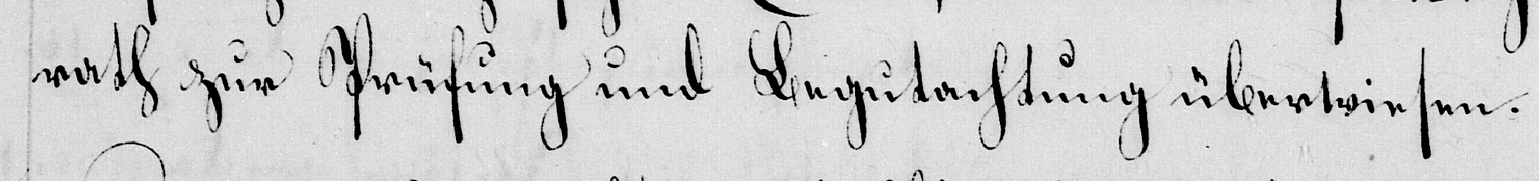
rath zur Prüfung und Begutachtung überwiesen.
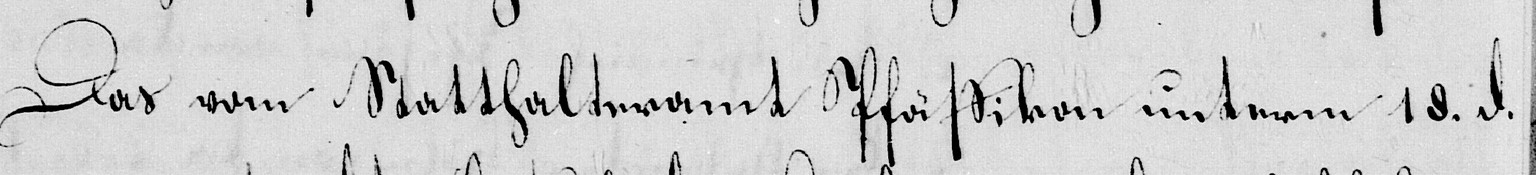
Das vom Statthalteramt Pfäffikon unterm 18. d.
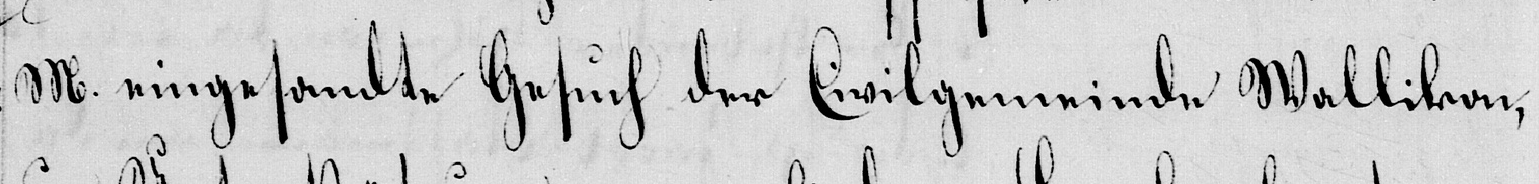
M. eingesandte Gesuch der Civilgemeinde Stallikon,
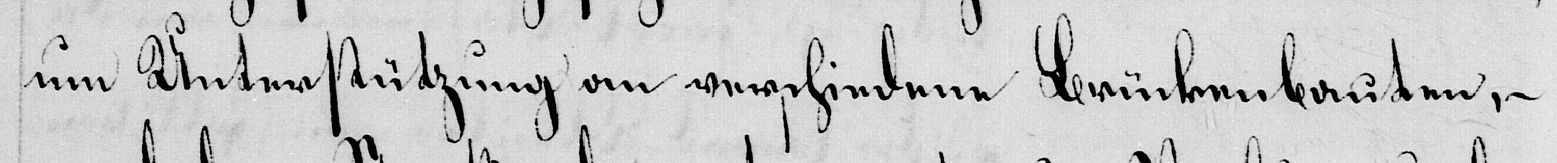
um Unterstützung an verschiedene Brückenbauten, –
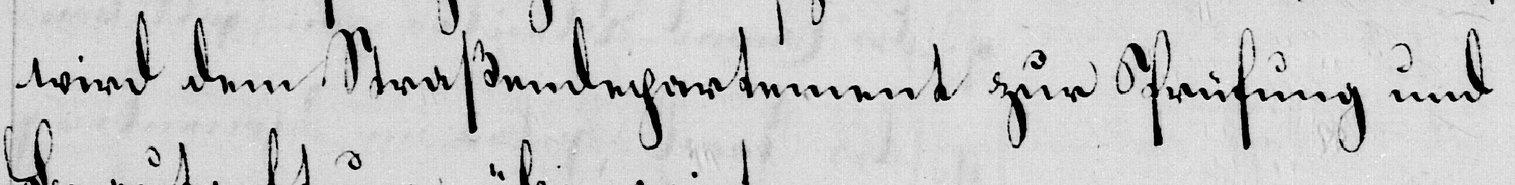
wird dem Straßendepartement zur Prüfung und
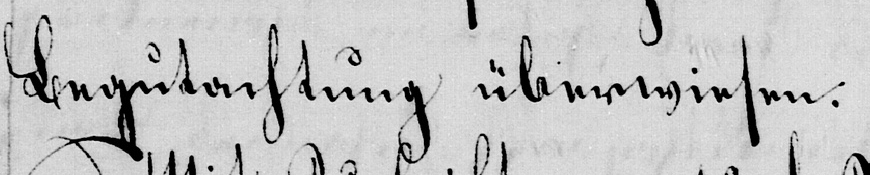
Begutachtung überwiesen.
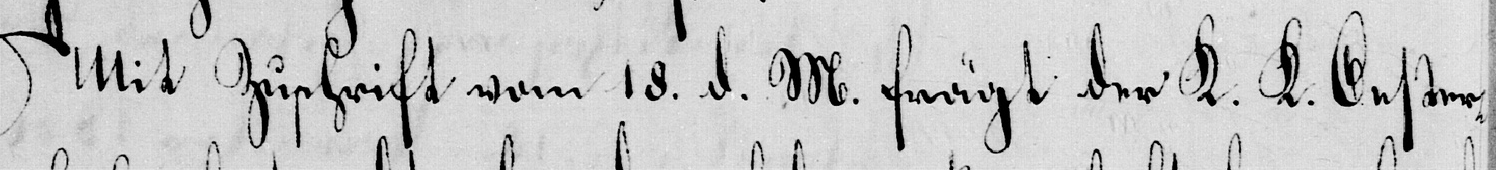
Mit Zuschrift vom 18. d. M. frägt der K. K. Oester¬
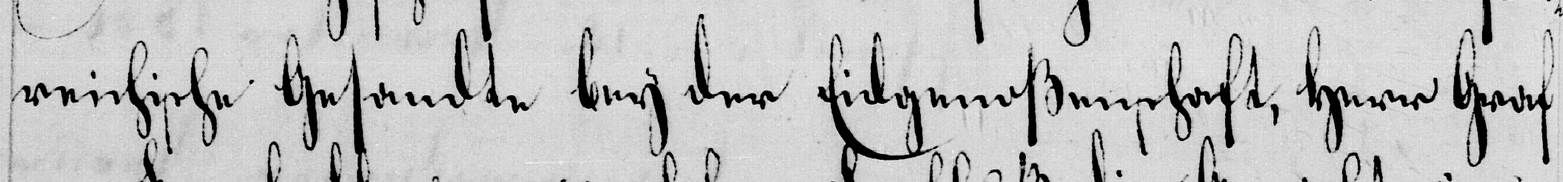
reichische Gesandte bey der Eidgenoßenschaft, Herr Graf
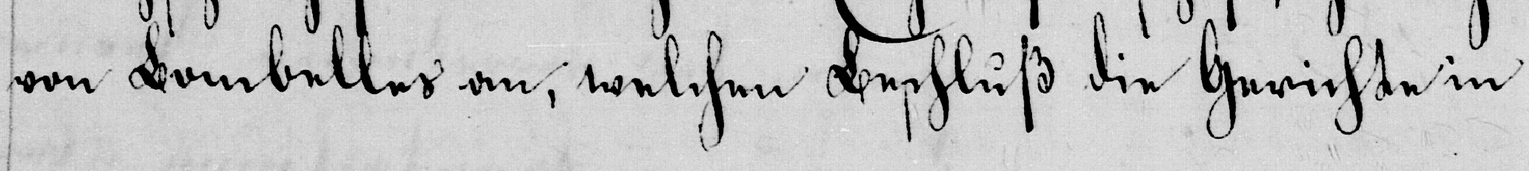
von Bombelles an, welchen Beschluß die Gerichte in
